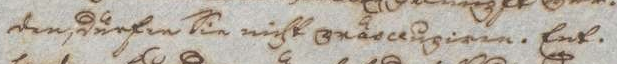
den, dürfen Sie nicht präoccupiren. Ent-
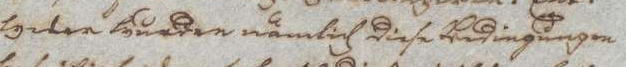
weder wurden nämlich diese Bedingungen
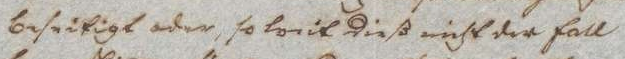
beseitigt oder, so weit dieß nicht der Fall
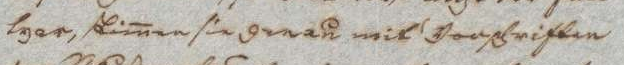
war, stimmen sie genau mit Vorschriften
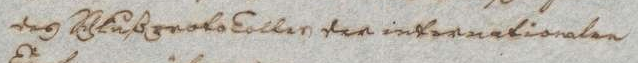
des Schlußprotokolles der internationalen
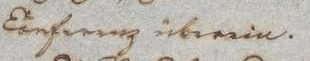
Conferenz überein.
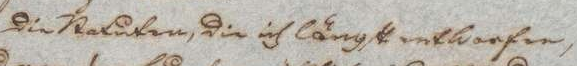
Die Statuten, die ich längst entworfen,
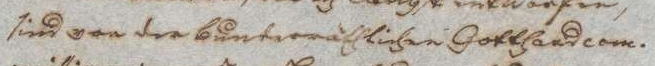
sind von der bundesräthlichen Gotthardcom-
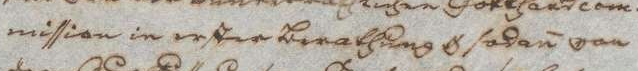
mission in erster Berathung & sodann von
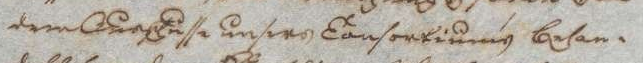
dem Ausschusse unsers Confortium's behan-
